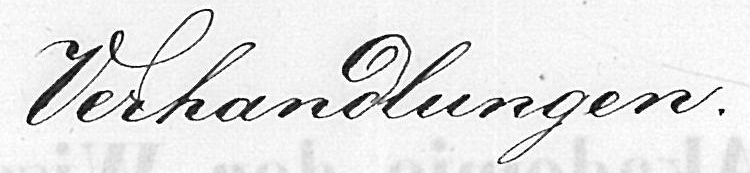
Verhandlungen.
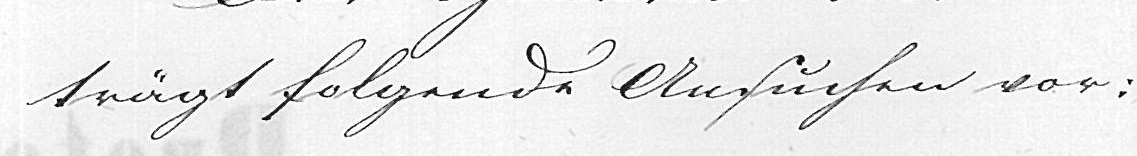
trägt folgende Ansuchen vor:
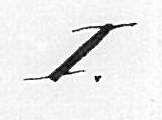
I.
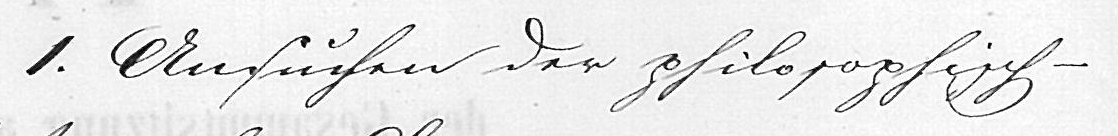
1. Ansuchen der philosophisch-
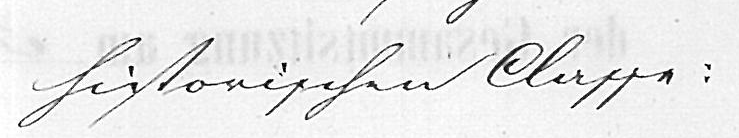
historischen Classe:
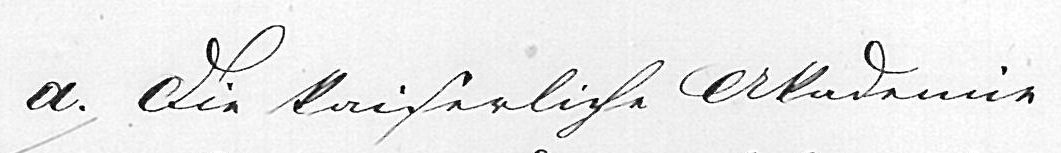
a. Die kaiserliche Akademie
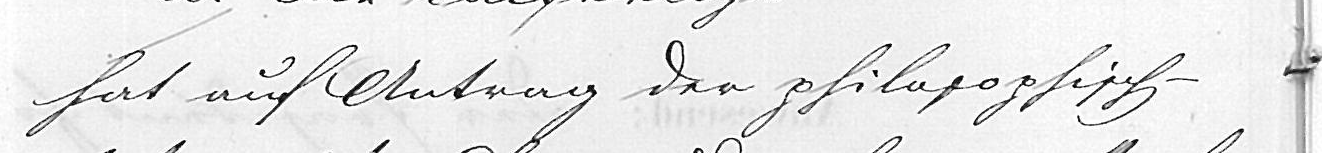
hat auf Antrag der philosophisch-
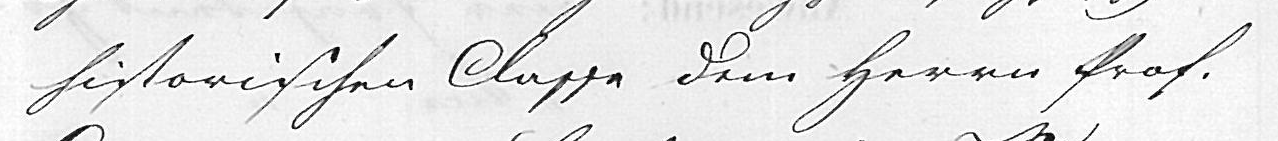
historischen Classe dem Herrn Prof.
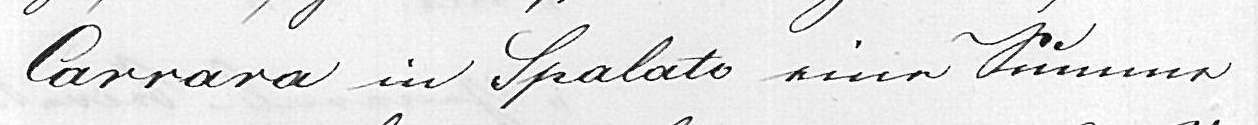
Carrara in Spalato eine Summe
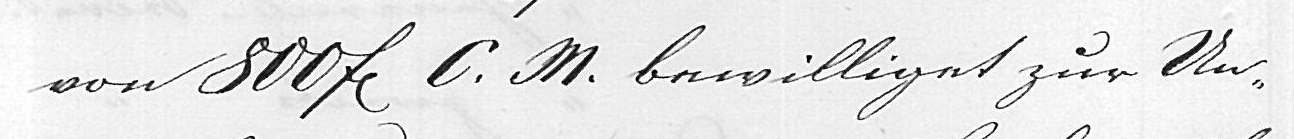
von 800 fl C. M. bewilliget zur Un-
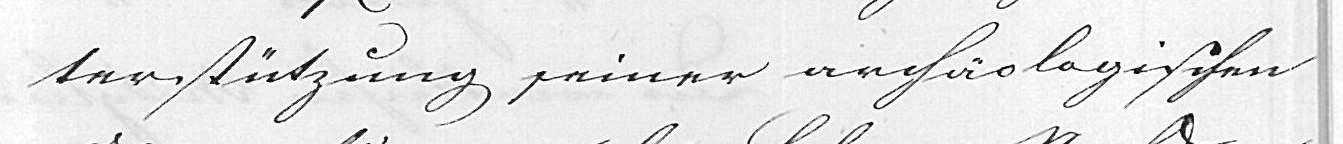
terstützung seiner archäologischen
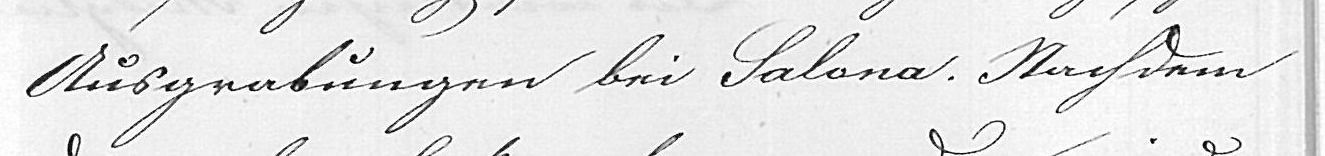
Ausgrabungen bei Salona. Nachdem
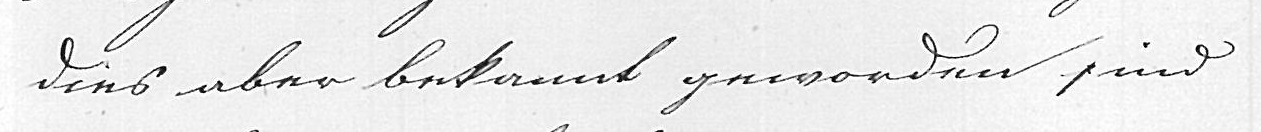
dies aber bekannt geworden sind
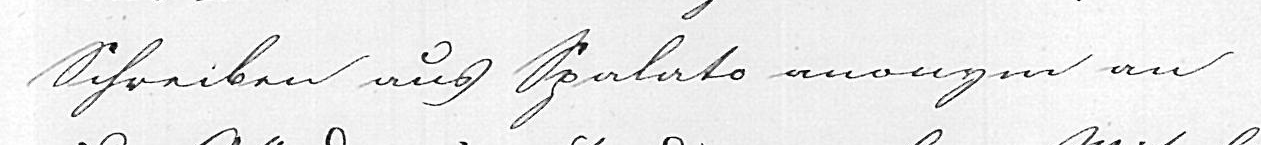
Schreiben aus Spalato anonym an
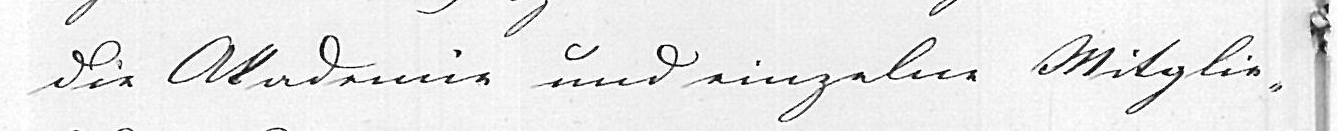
die Akademie und einzelne Mitglie-
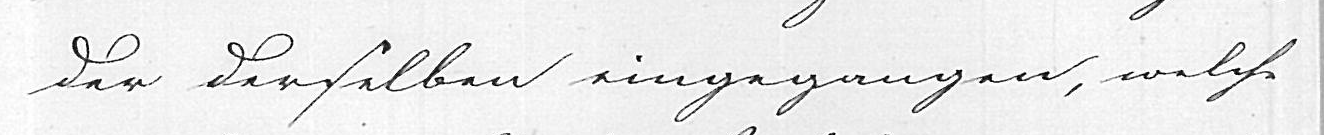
der derselben eingegangen, welche
